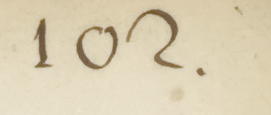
102.
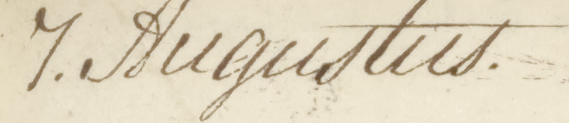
7. Augustus.
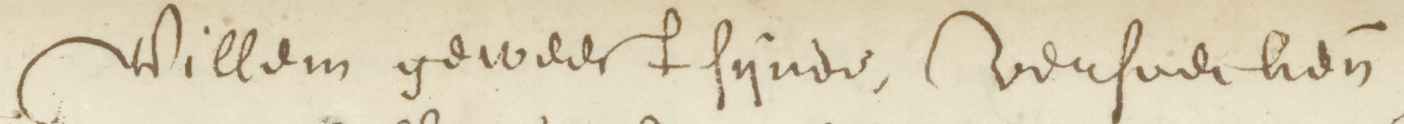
Willem geweest sijnde, versoecken
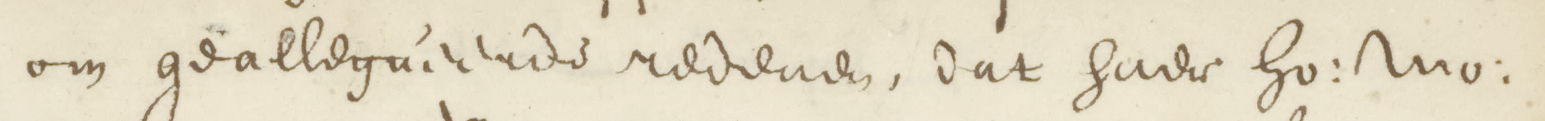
om geallegueerde redenen, dat haer ho:mo:
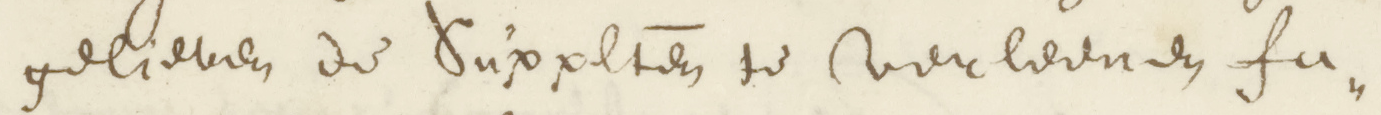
gelieven de Supplten te verleenen fa„
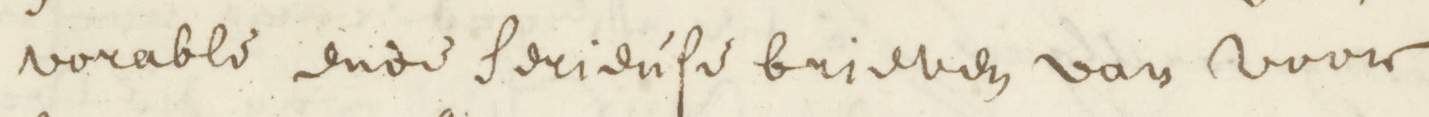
vorable ende serieuse brieven van voor„
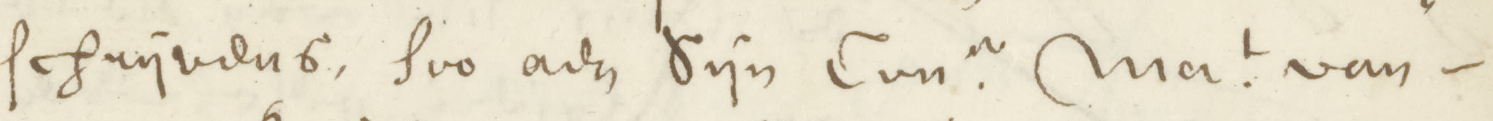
schrijvens, soo aen Sijn Cone. Mat. van —
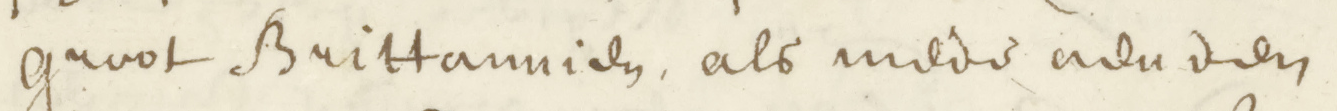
Groot Brittannien, als mede aen den
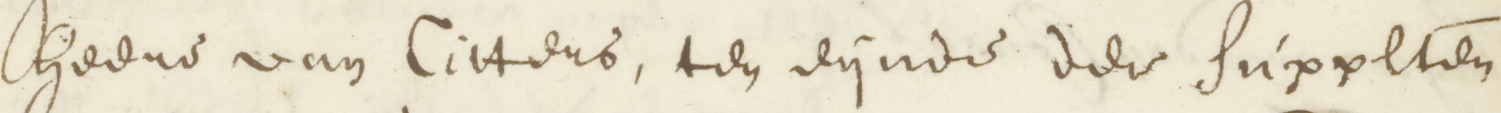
heere van Citters, ten eijnde der Supplten
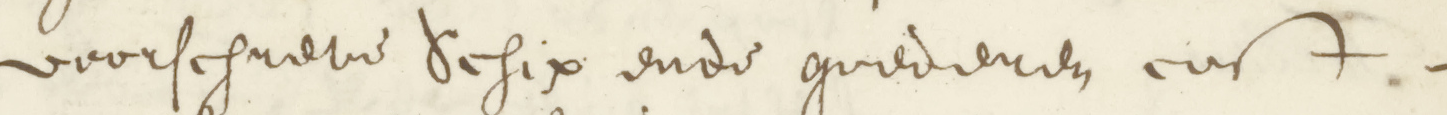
voorschreve Schip ende goederen cost
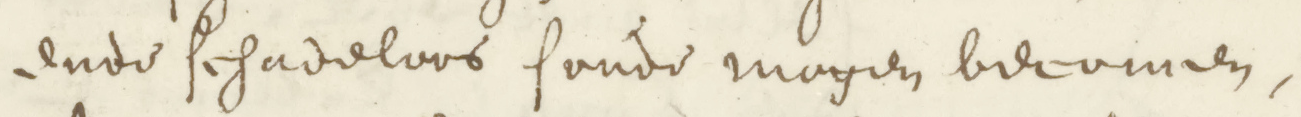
ende schadeloos soude mogen becomen;
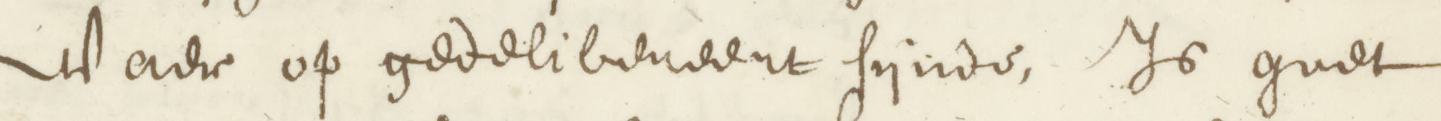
Waer op gedelibereert sijnde, Is goet
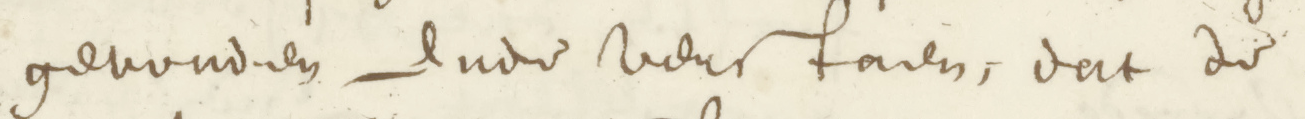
gevonden ende verstaen, dat de
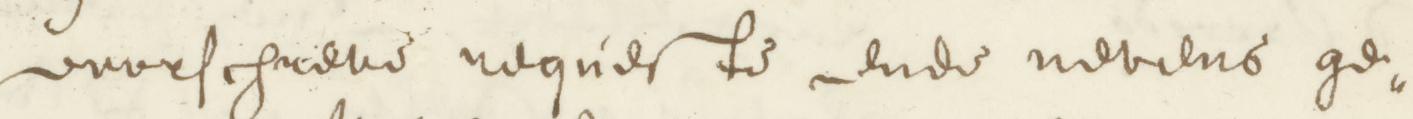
voorschreve requeste ende nevens ge„
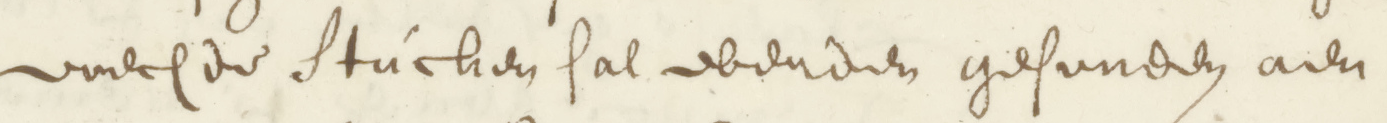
voechde stucken sal werden gesonden aen
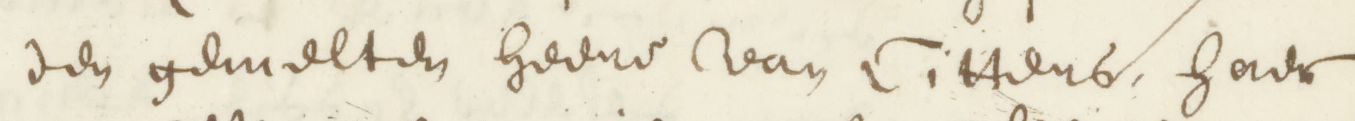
den gemelten heere van Citters, haer
